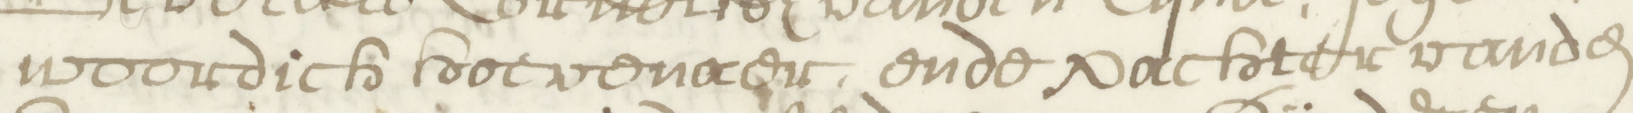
woordich hoevenaer, ende pachter vanden
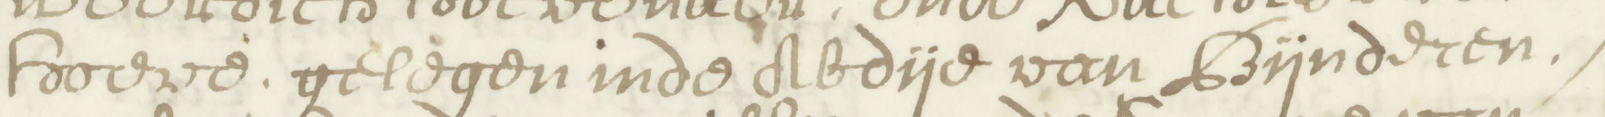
hoeve, gelegen inde Abdije van Bijnderen,
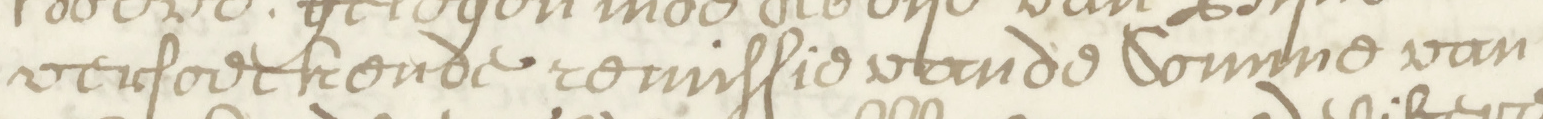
versoeckende remissie vande Somme van
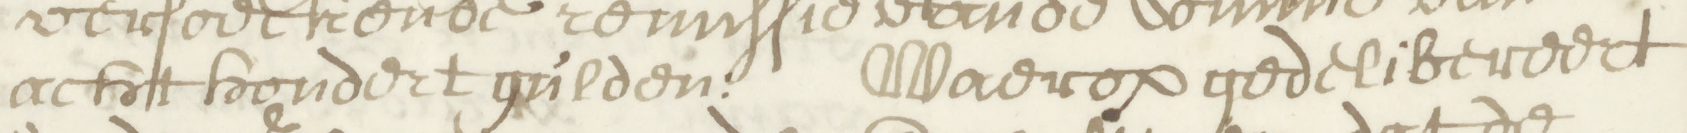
acht hondert gulden: Waerop gedelibereert
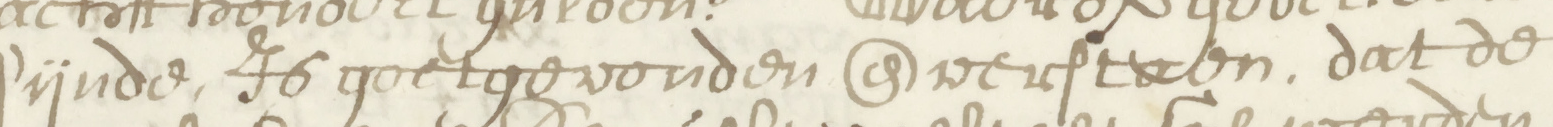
sijnde, Is goetgevonden & verstaen, dat de
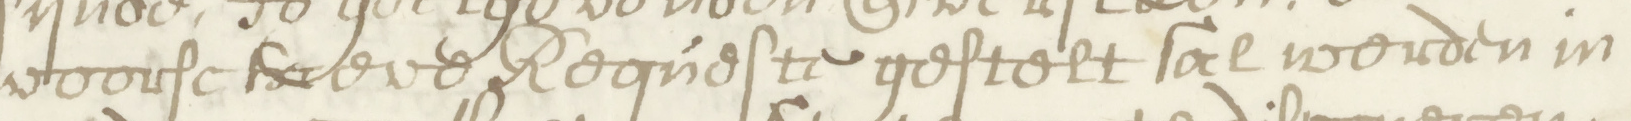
voorschreve Requeste gestelt sal werden in
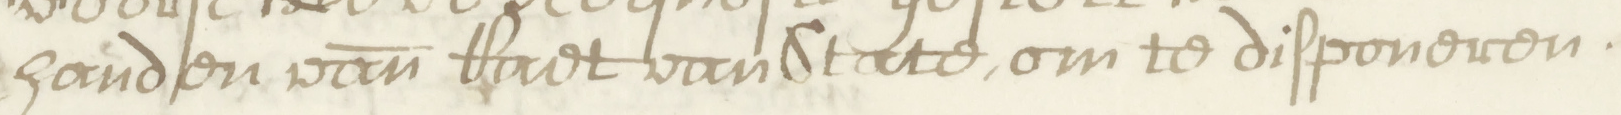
handen van Raet van State, om te disponeren.
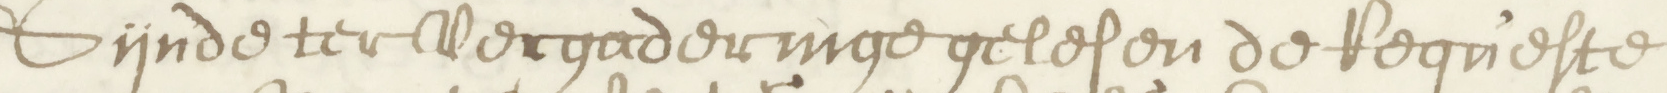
Sijnde ter Vergaderinge gelesen de Requeste
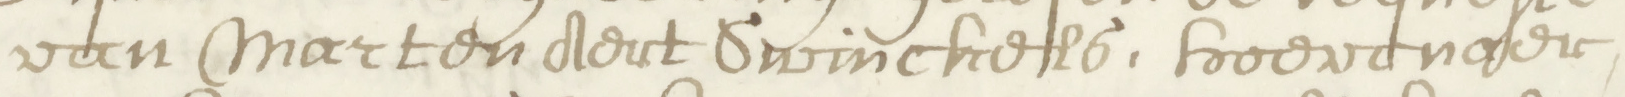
van Marten Aert Swinckels, hoevenaer
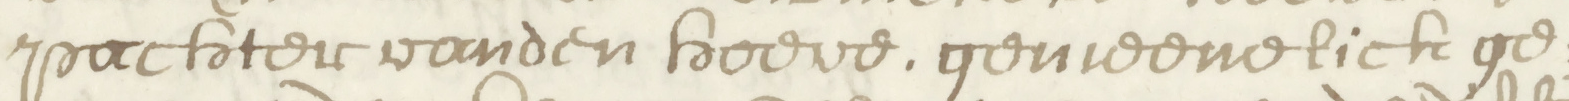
prachter vanden hoeve gemeenelick ge=
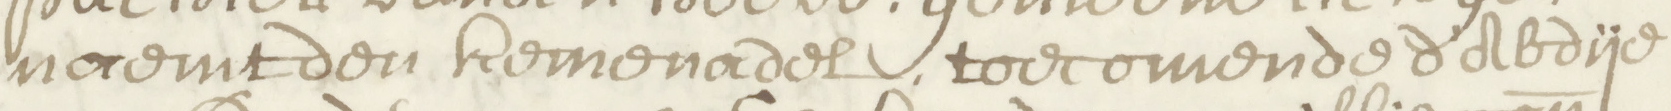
naemt den kemenadel, toecomende d'Abdije
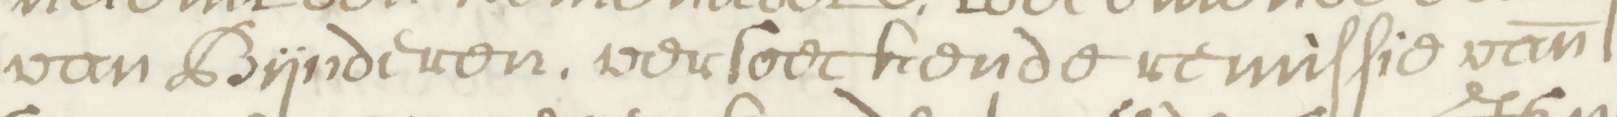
van Bijnderen, versoeckende remissie van
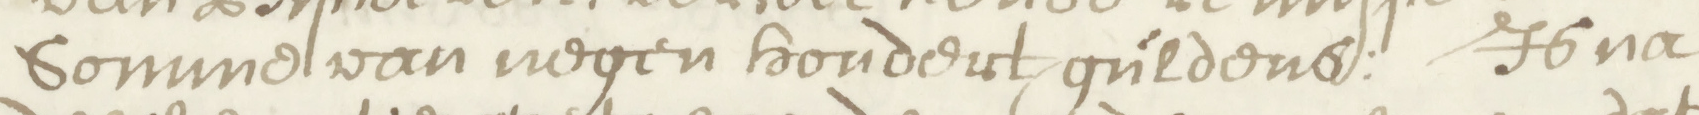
Somme van negen hondert guldens: Is na
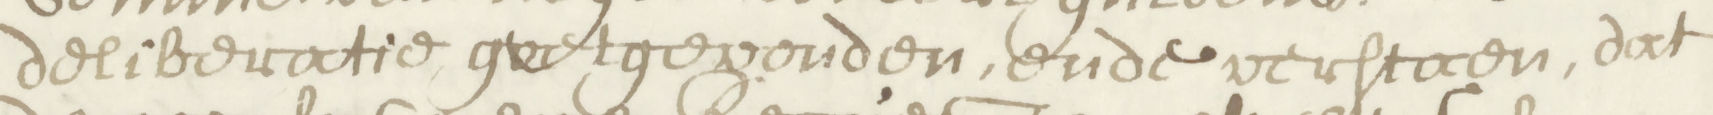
deliberatie goetgevonden, ende verstaen, dat
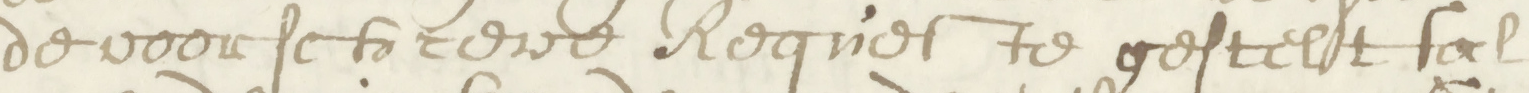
de voorschreve Requeste gestelt sal
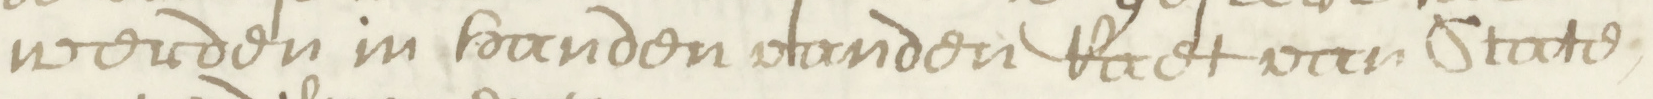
werden in handen vanden Raet van State,
